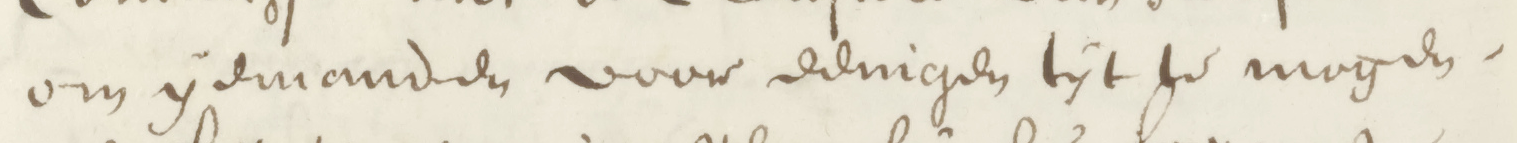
om ijemanden voor eenigen tijt te mogen
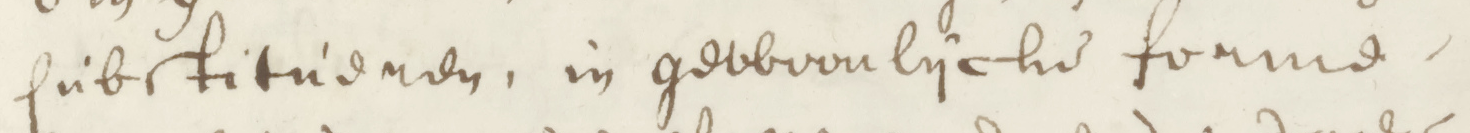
substitueren, in gewoonlijcke forme
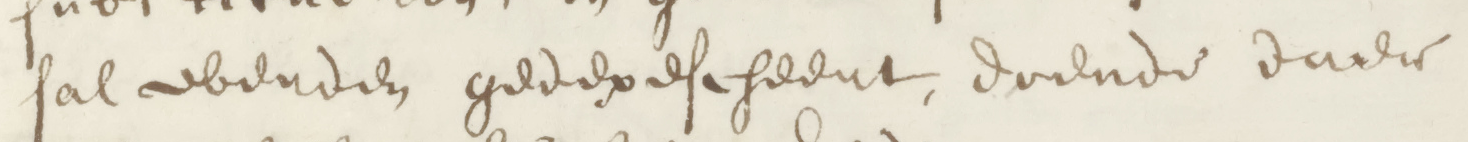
sal werden gedepescheert, doende daer
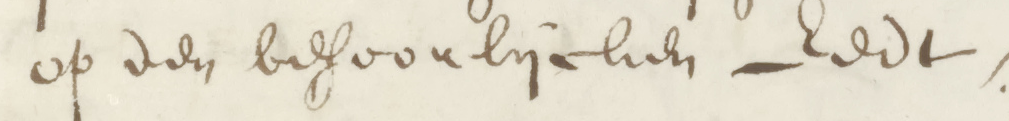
op den behoorlijcken Eedt.
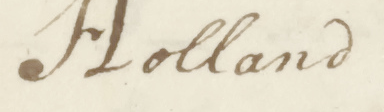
Holland
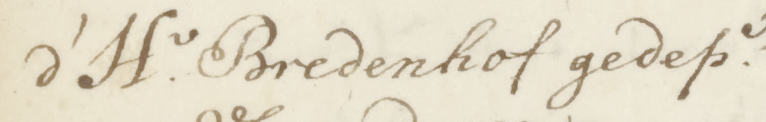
d‛ Hr. van Bredenhof gedepe
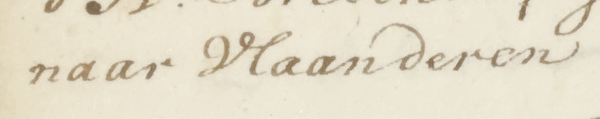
naar Vlaanderen
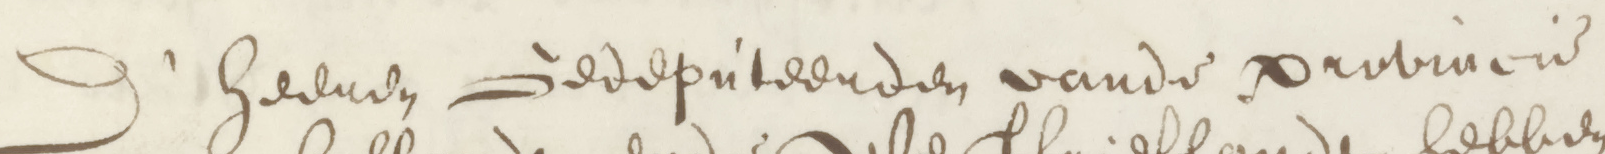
D‛ heeren Gedeputeerden vande Provincie
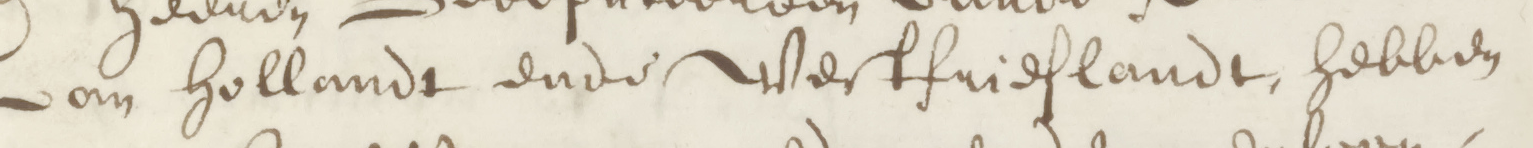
van hollandt ende Westfrieslandt, hebben
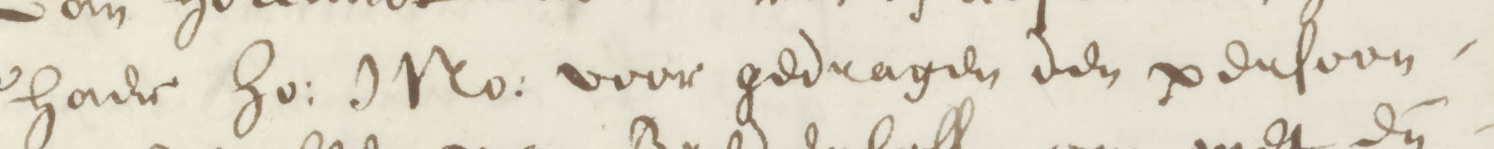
haer ho:Mo: voor gedragen den persoon
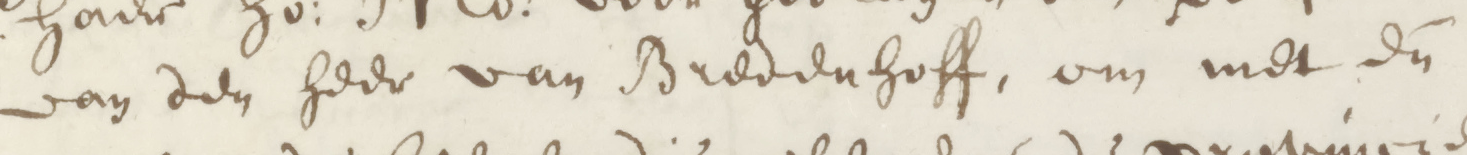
van den heer van Bredenhoff, om met en
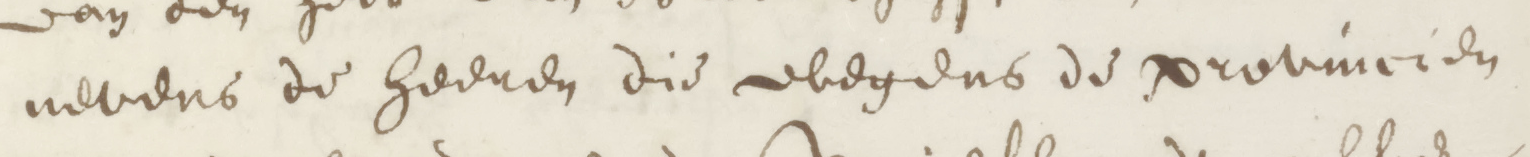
nevens de heeren die wegens de provincien
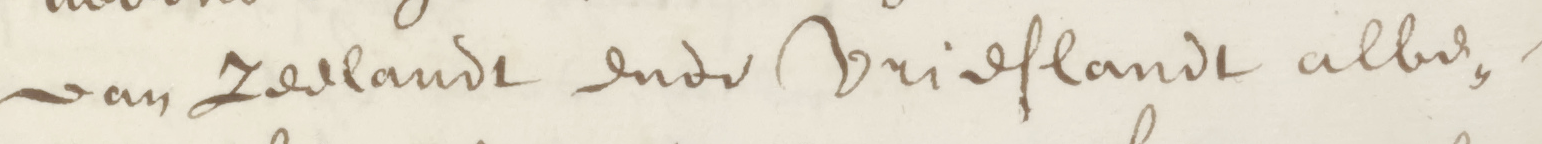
van Zeelandt ende Vrieslandt albe„
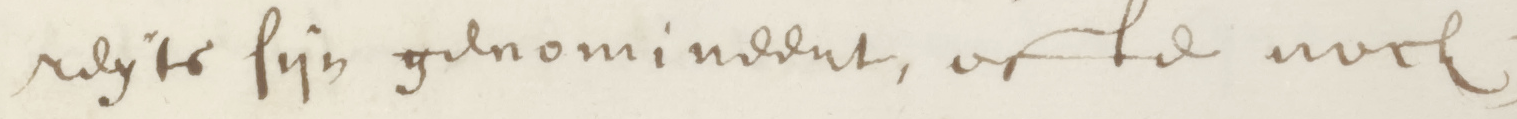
reijts sijn genomineert, ofte noch
